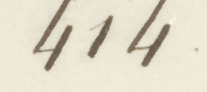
414
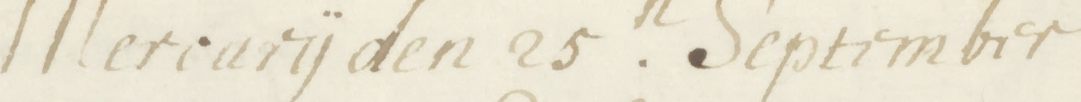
Mercurij den 25n. September.
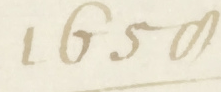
1658
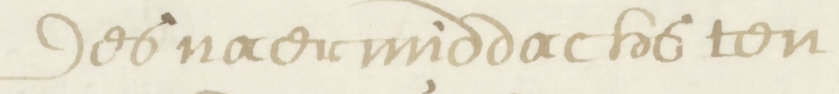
Des naermiddachs ten
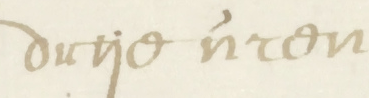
drije uren.
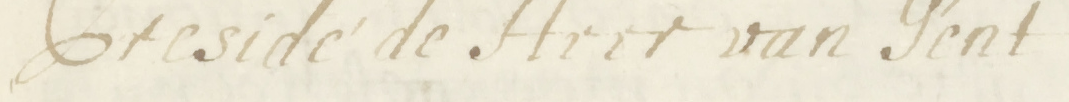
Preside de Heer van Gent
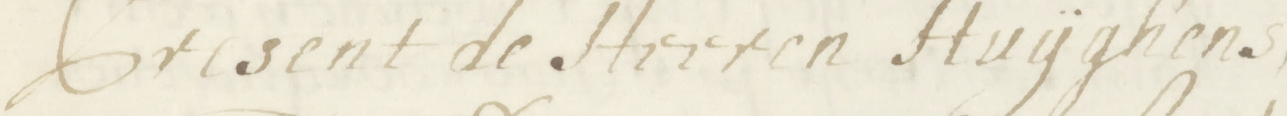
Present de Heeren Huijghens,
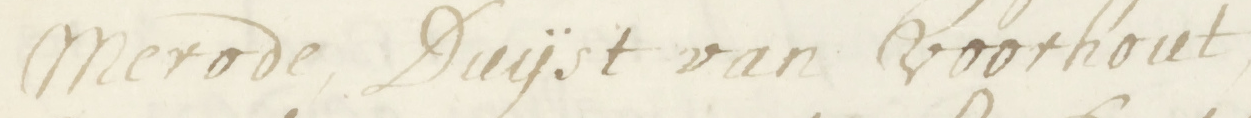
Merode, Duijst van Voorhout,
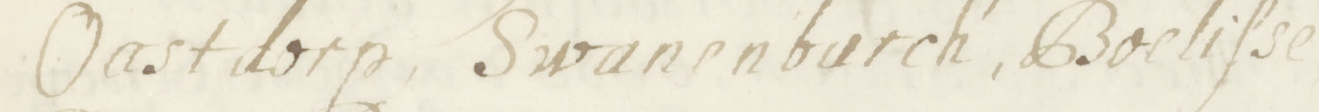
Oostdorp, Swanenburch, Boelisse
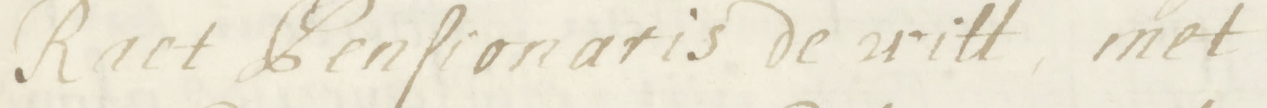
Raet Pensionaris de witt, met
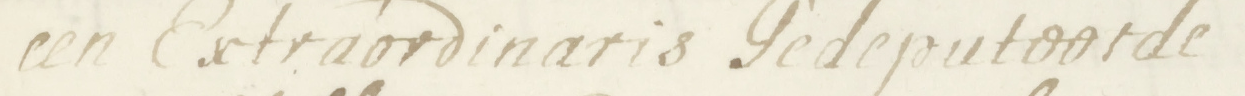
een Extraordinaris Gedeputeerde
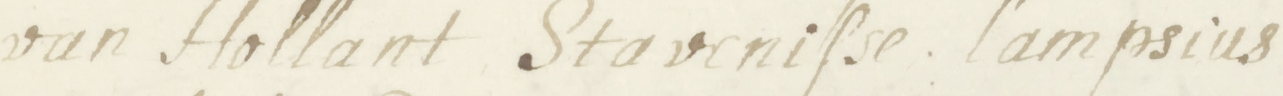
van Hollant Stavenisse, Lampsius
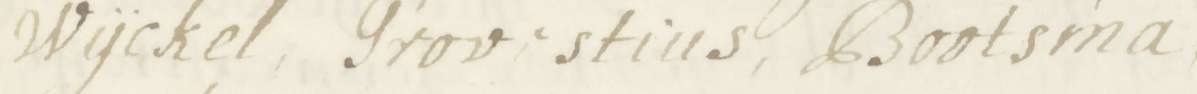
Wijckel, Grovestins, Bootsma,
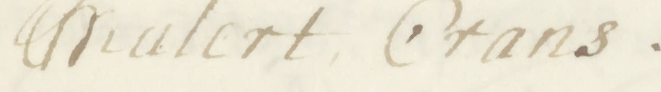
Mulert, Crans.
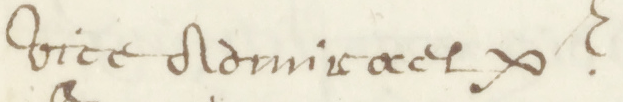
vice Admirael pr.
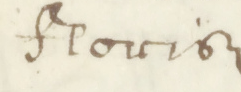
Florisz
